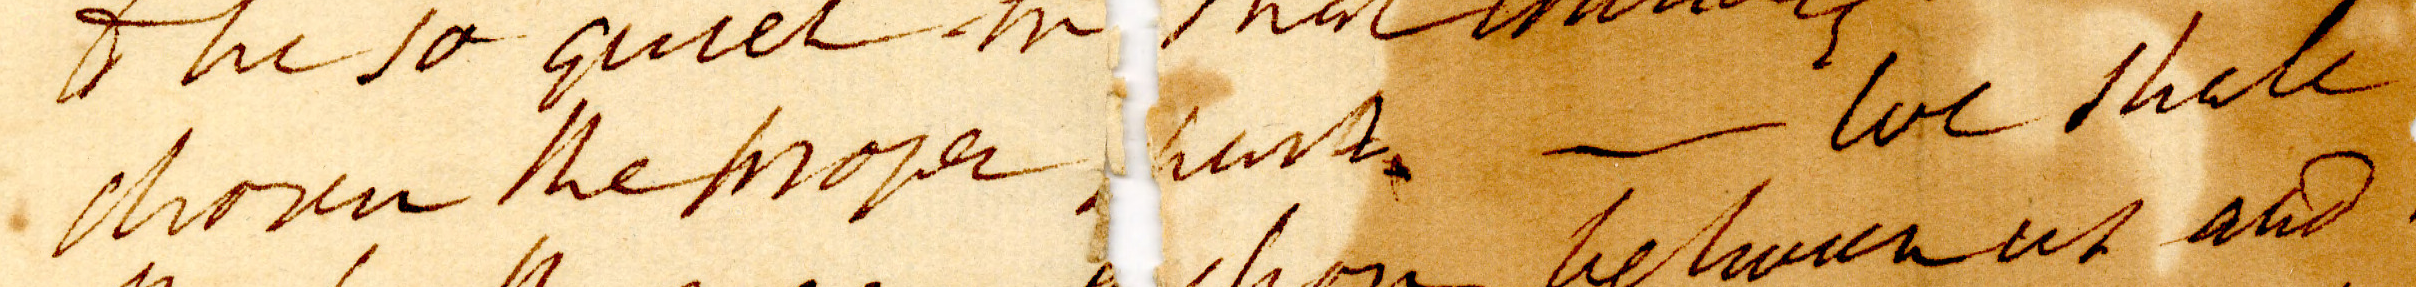chosen the proper part.- We shall
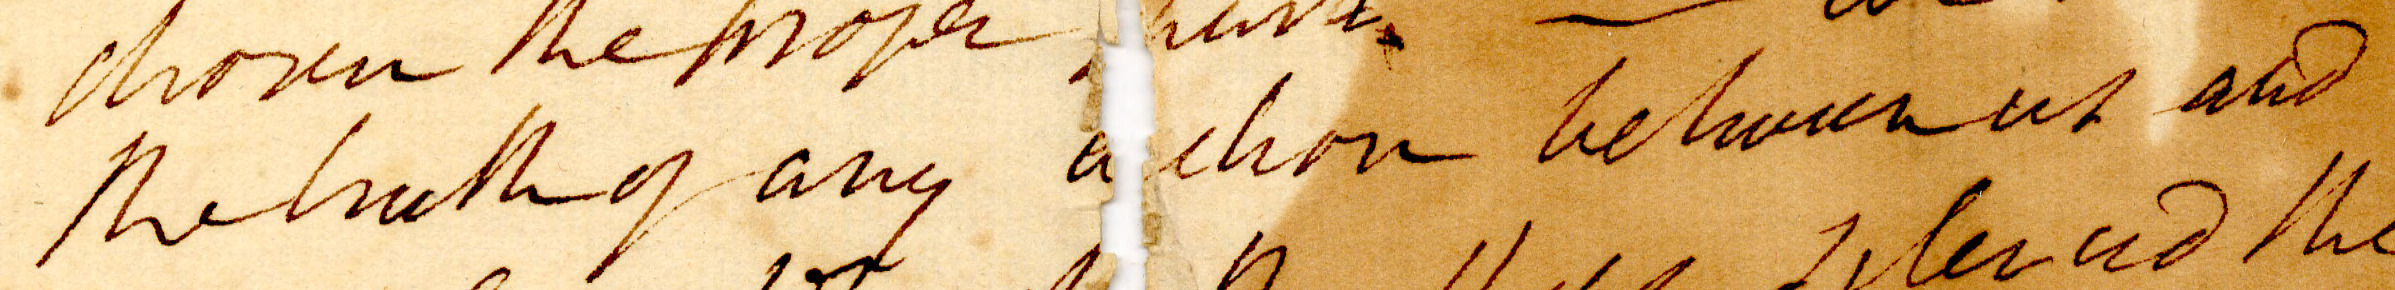the bulk of any anchor between us and
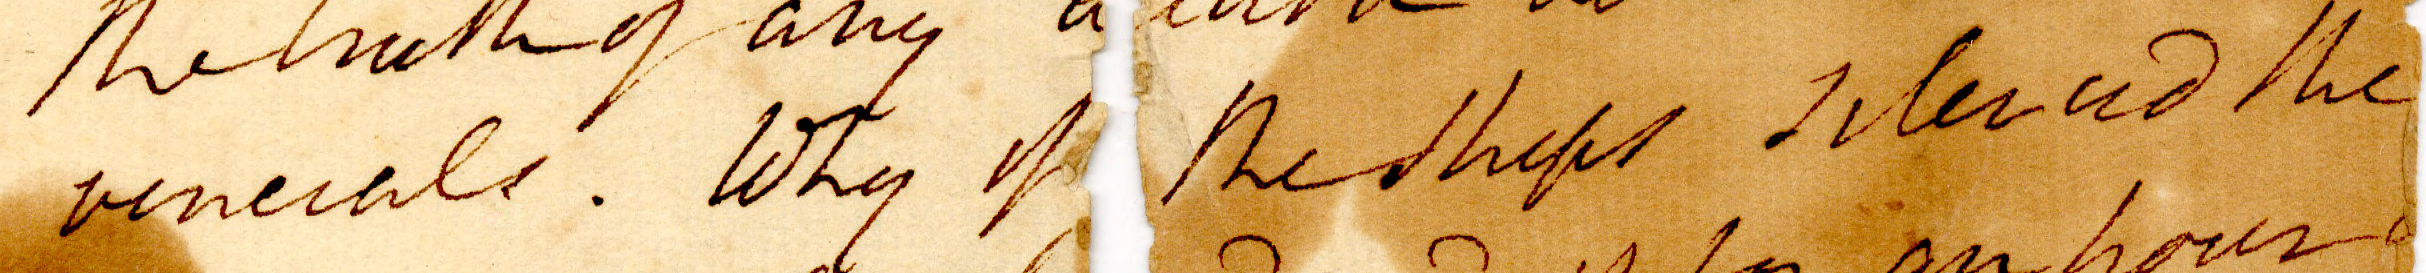vincials. Why of the ships selected the
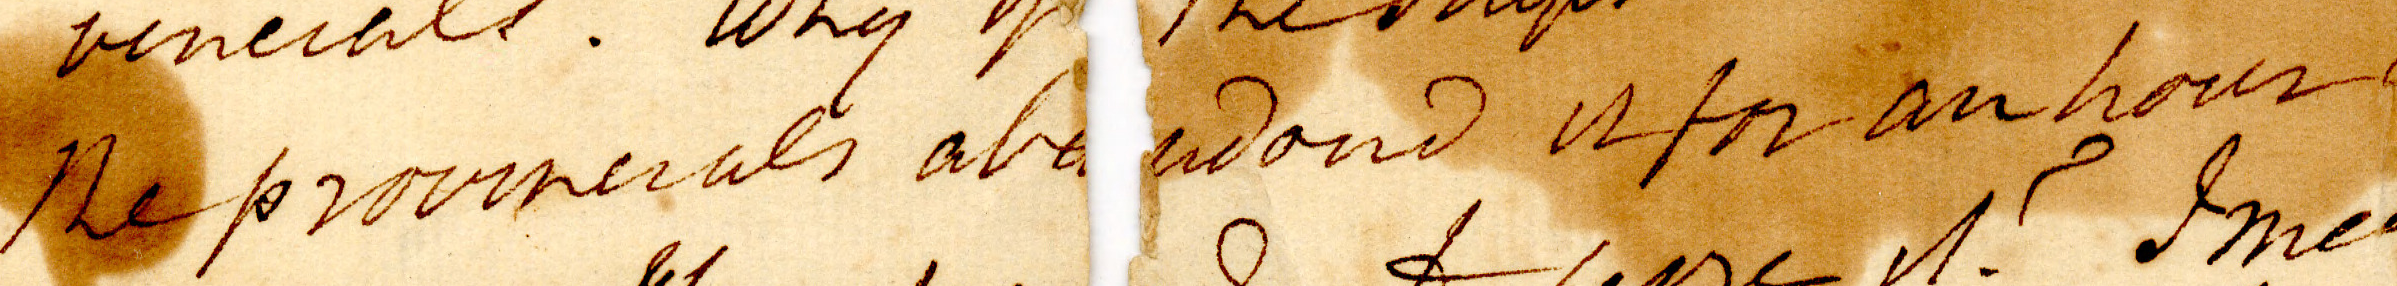the provinerals abandon'd it for an hour
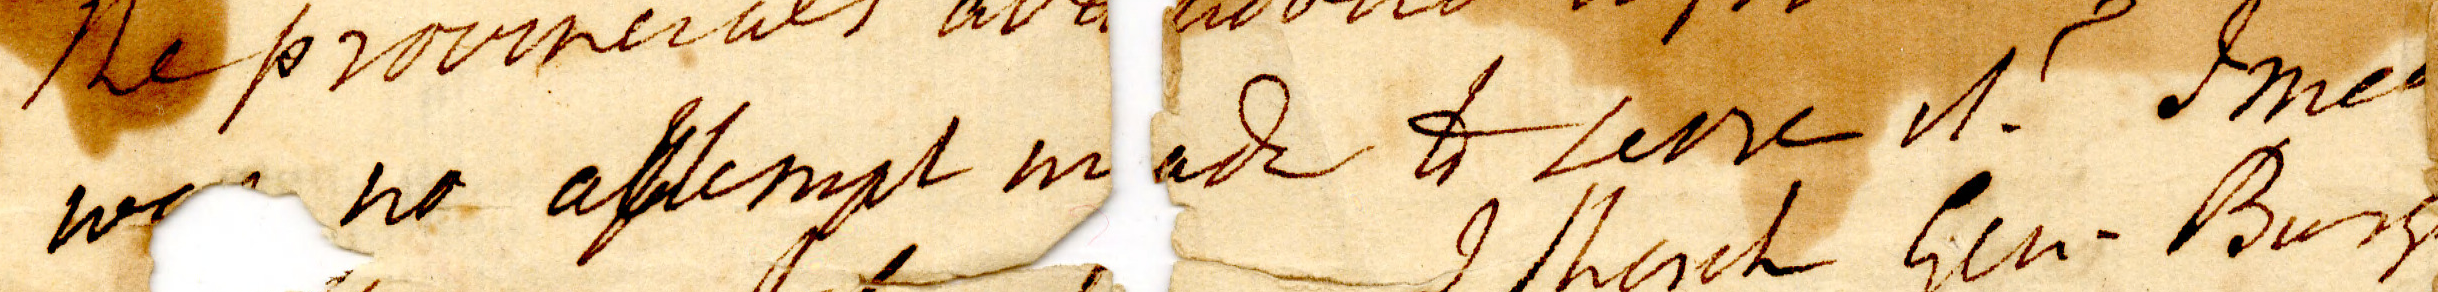[was] no attempt made to sevre it? I me
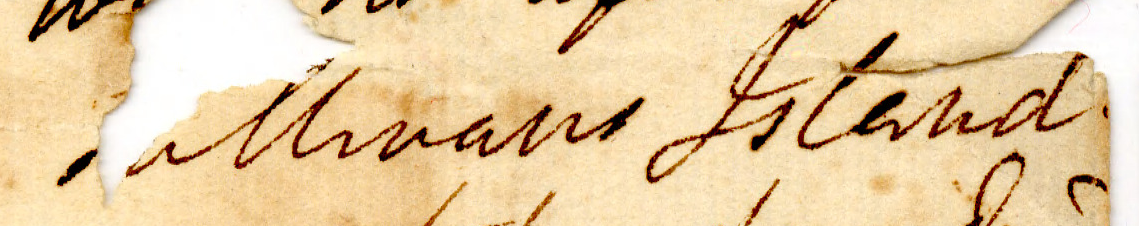Sullivans Island
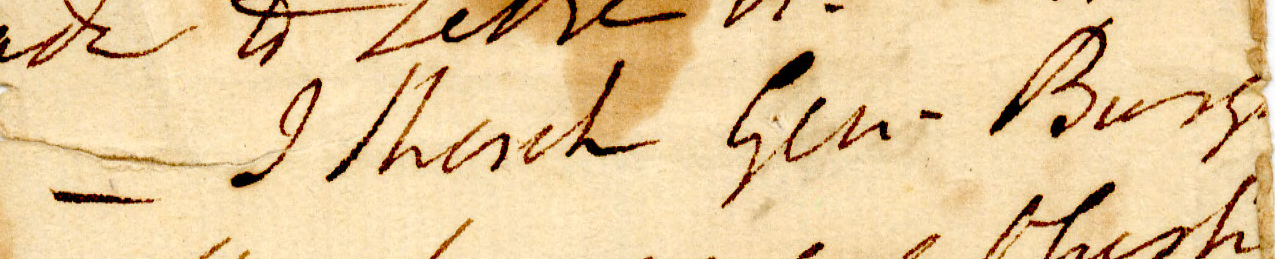- I thank Gen. Burg
